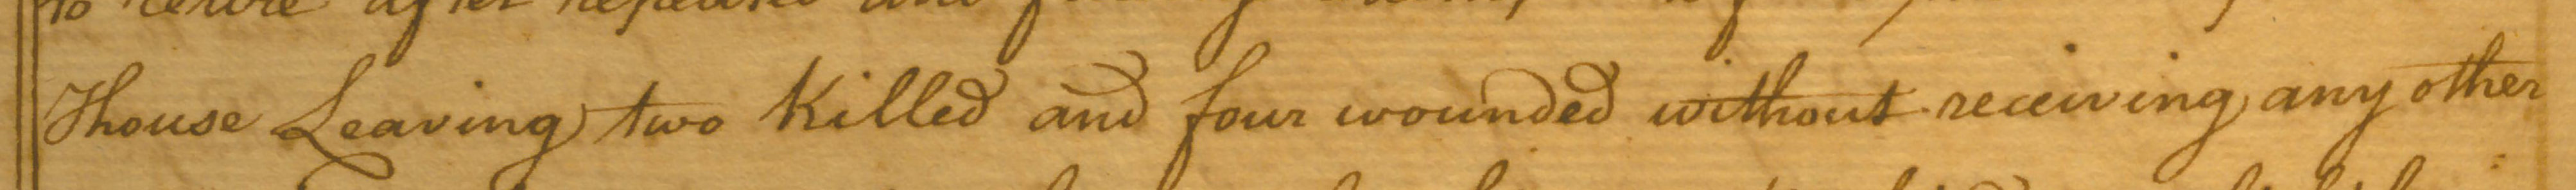House Leaving two Killed and four wounded without receiving any other
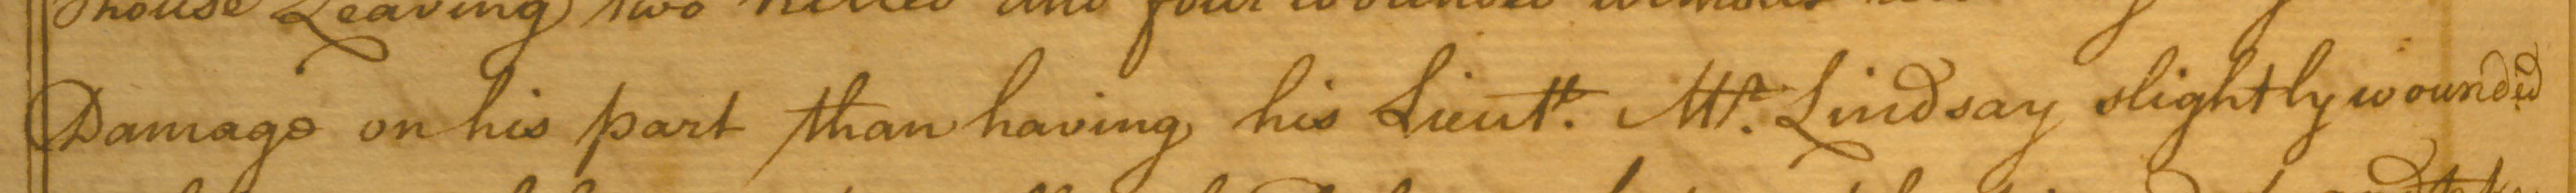Damage on his part than having his Lieut^t. M^r. Lindsay slightly wounded
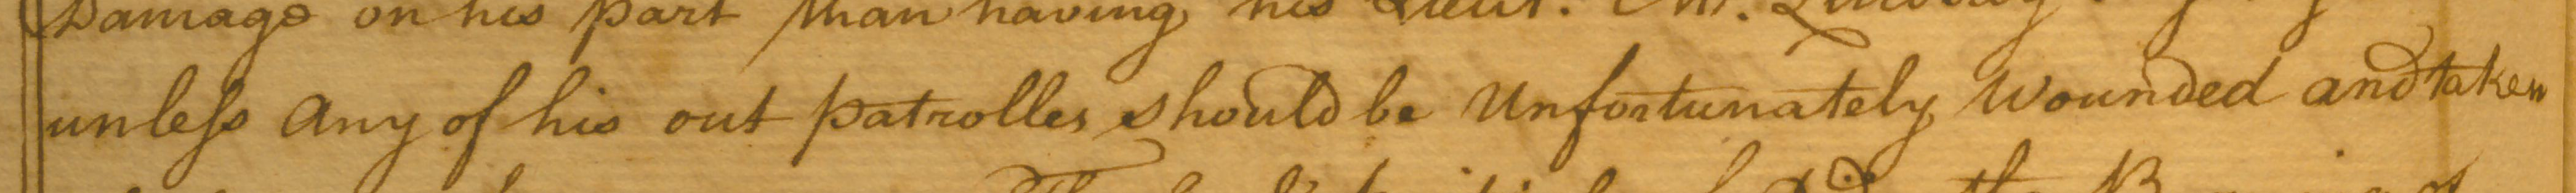unless any of his out patrolles should be unfortunately wounded and taken
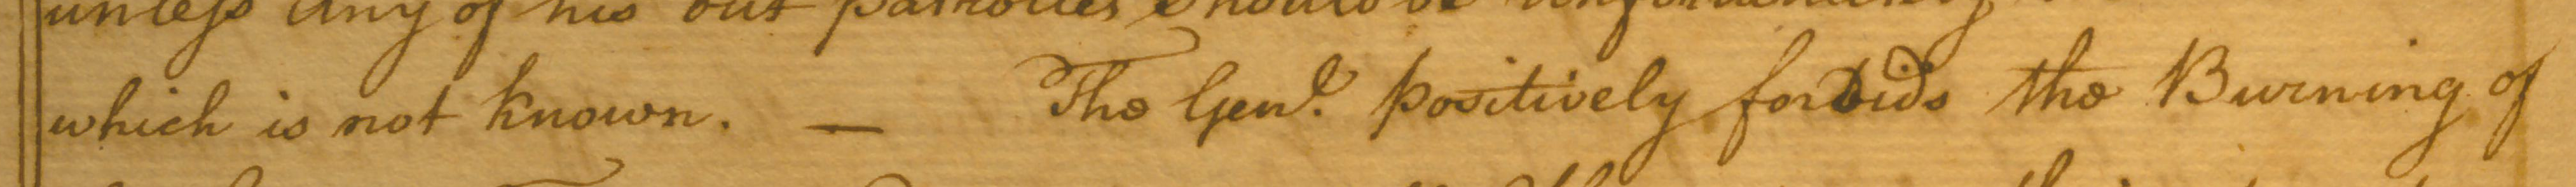which is not known.- The Gen^l. positively forbids the Burning of
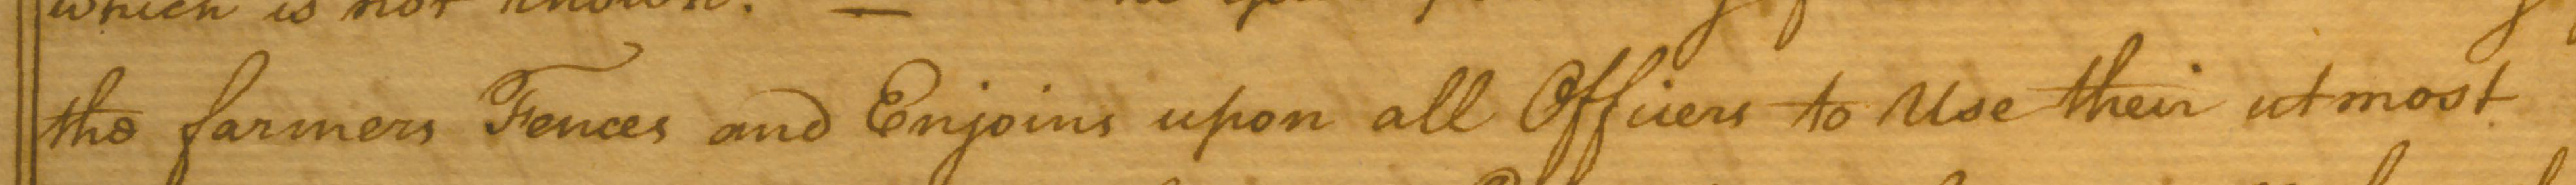the farmers Fence and Enjoins upon all Officers to use their utmost
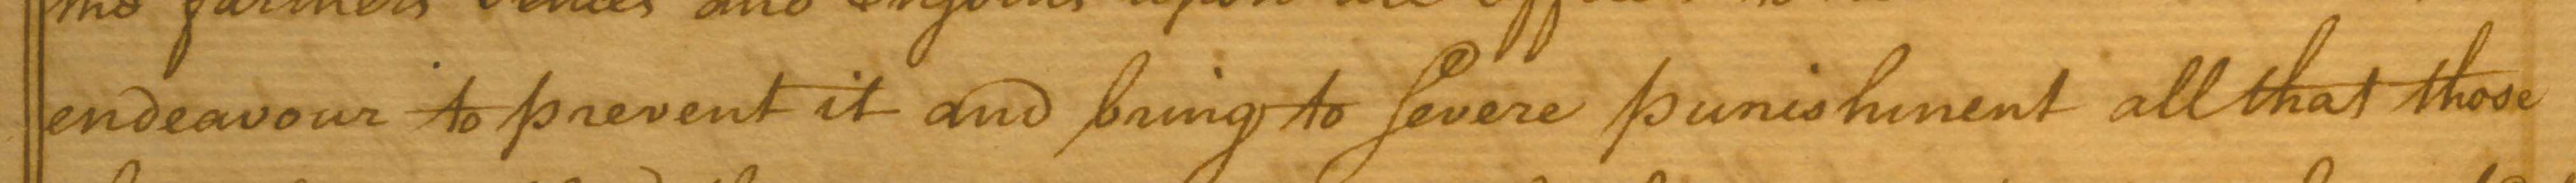endeavour to prevent it and bring to severe punishment all that those
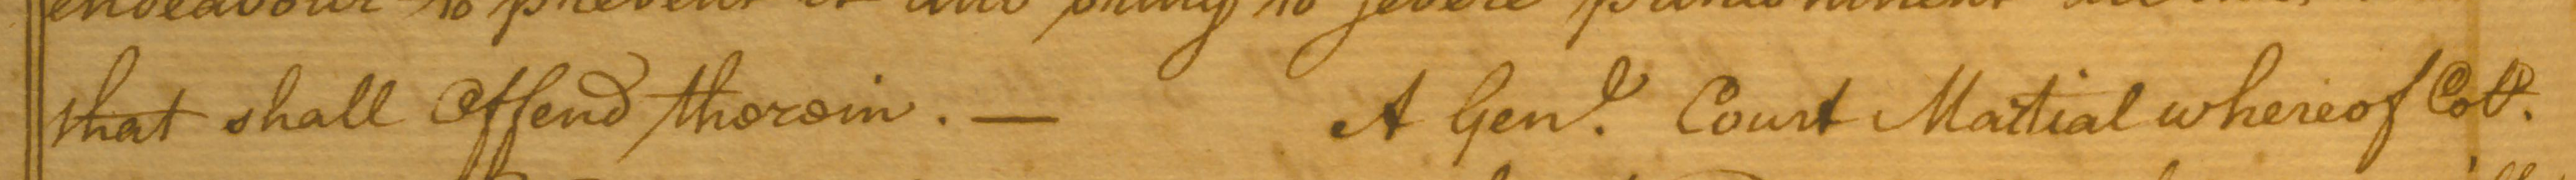that shall Offend therein.- A Gen^l. Court Martial whereof Col^o.
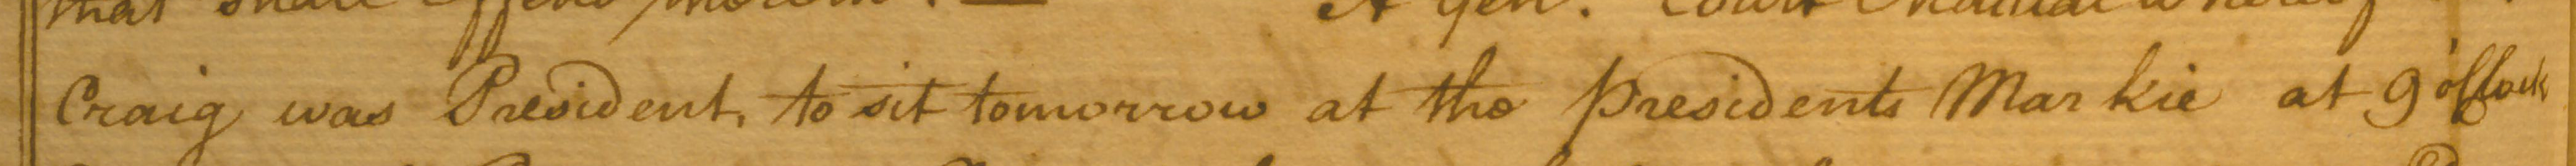Craig was president to sit tomorrow at the Presidents Markie at 9 o'Clock
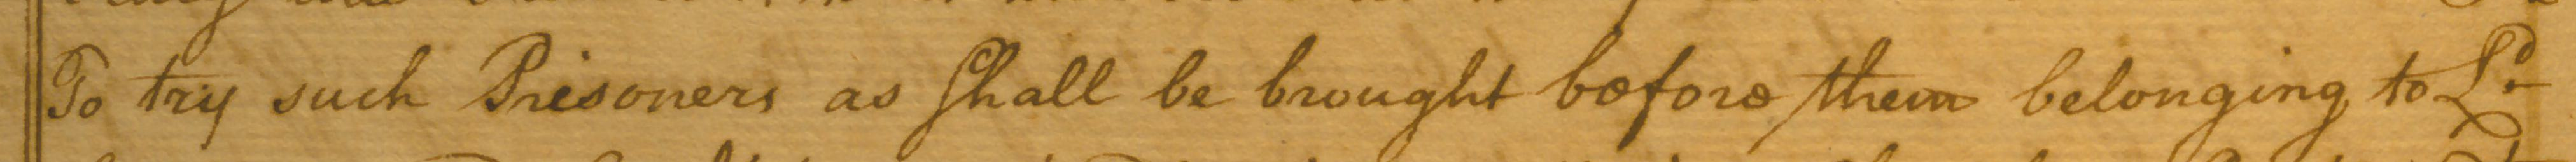To try such Prisoners as shall be brought before them belonging to L^d.
